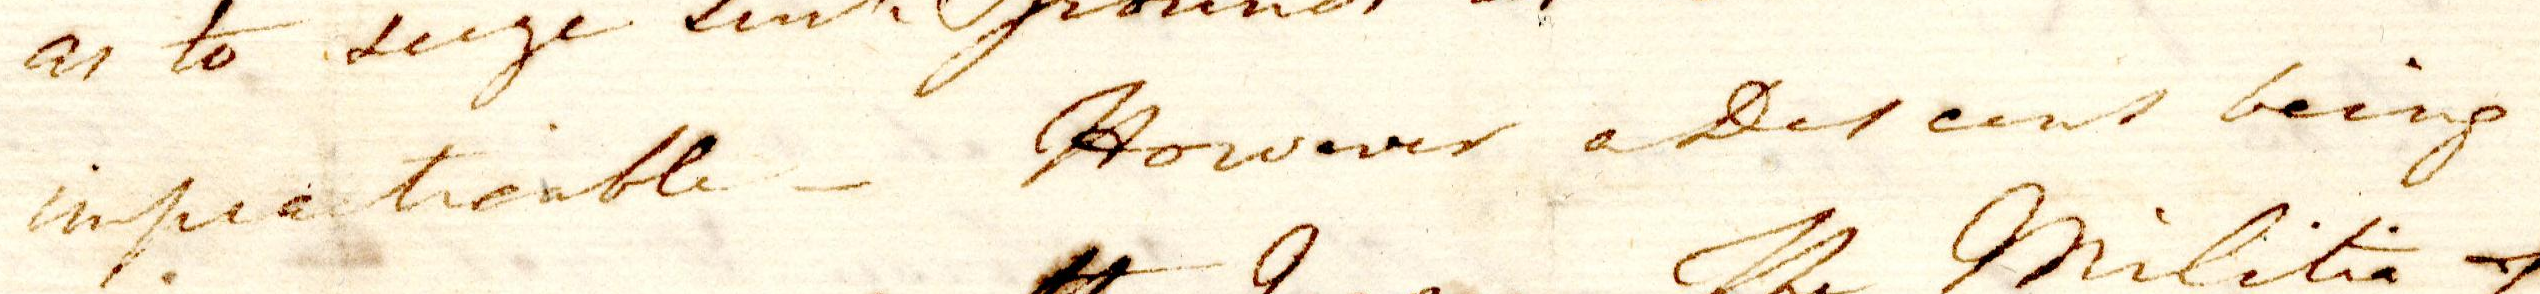inpracticable. However a Descent being
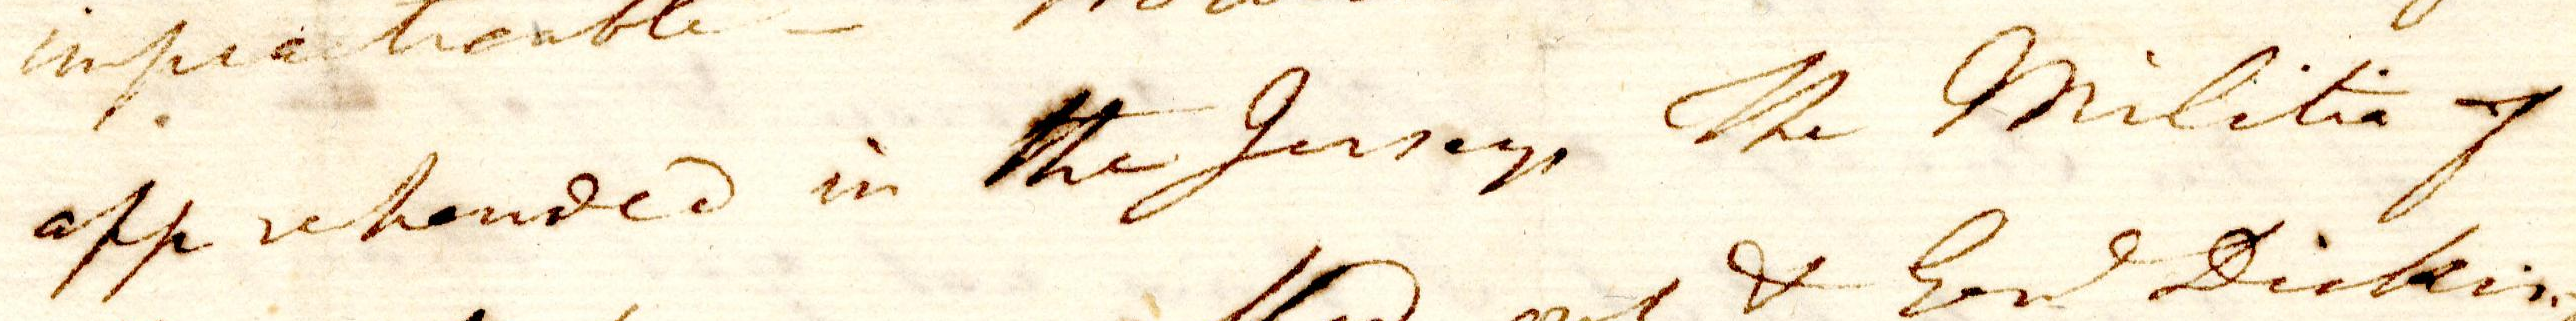apprehended in the Jersey, The Militia of
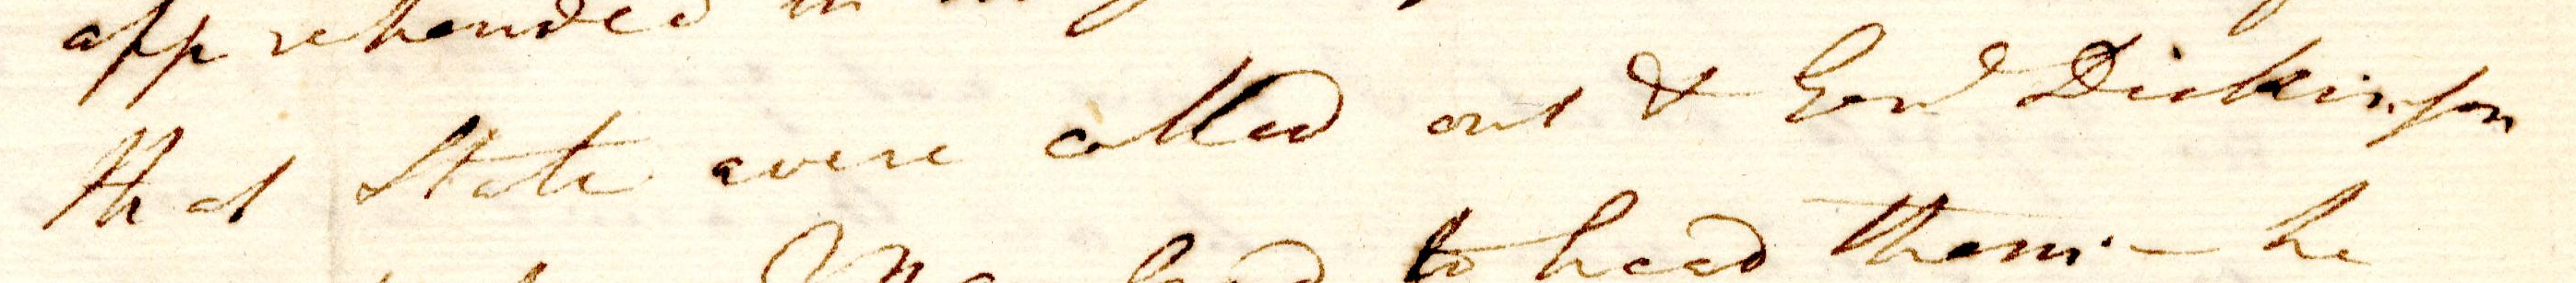that State were called out & Gen^l Dickinson
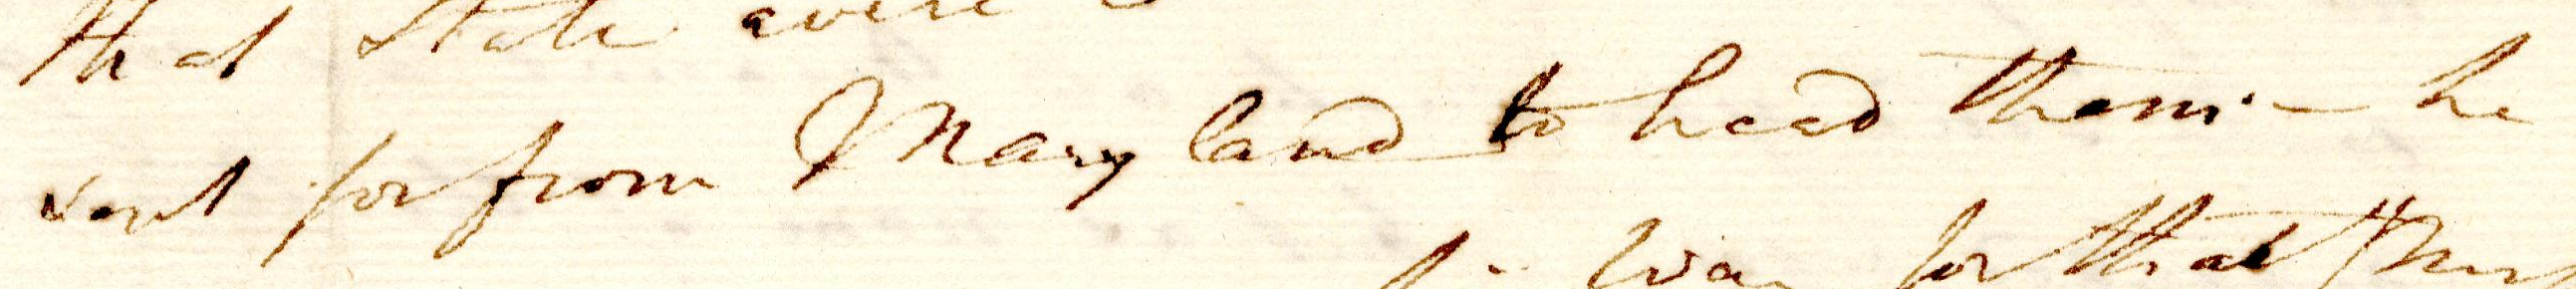sent for from Maryland to heed them. he
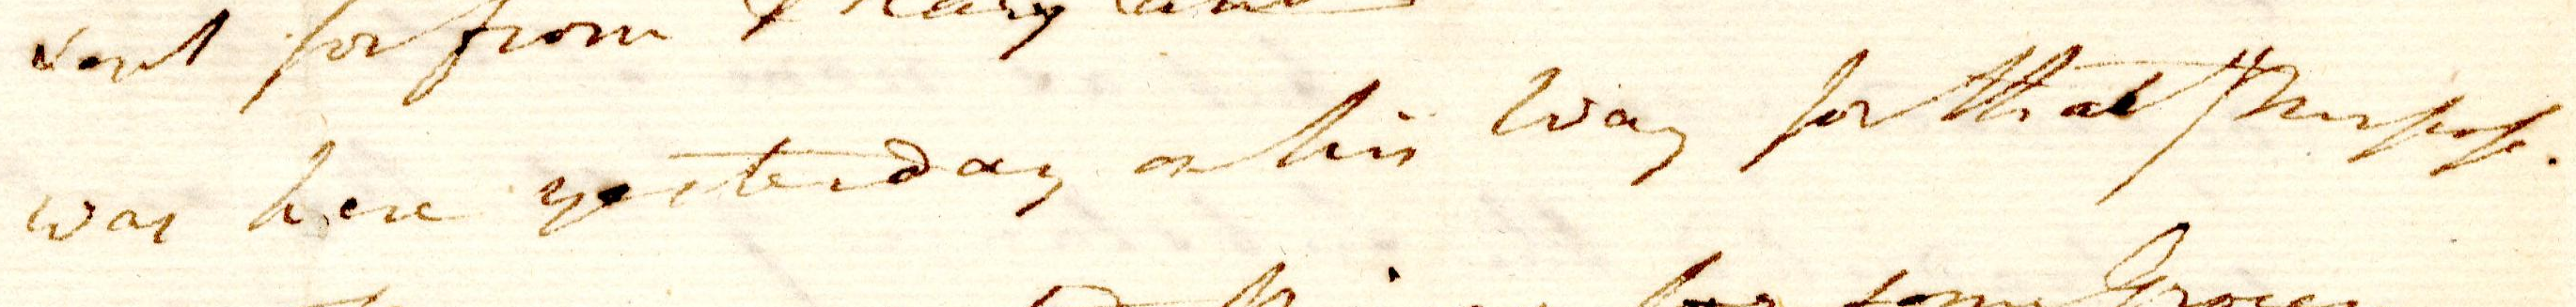was here yesterday on his way for that purpose.
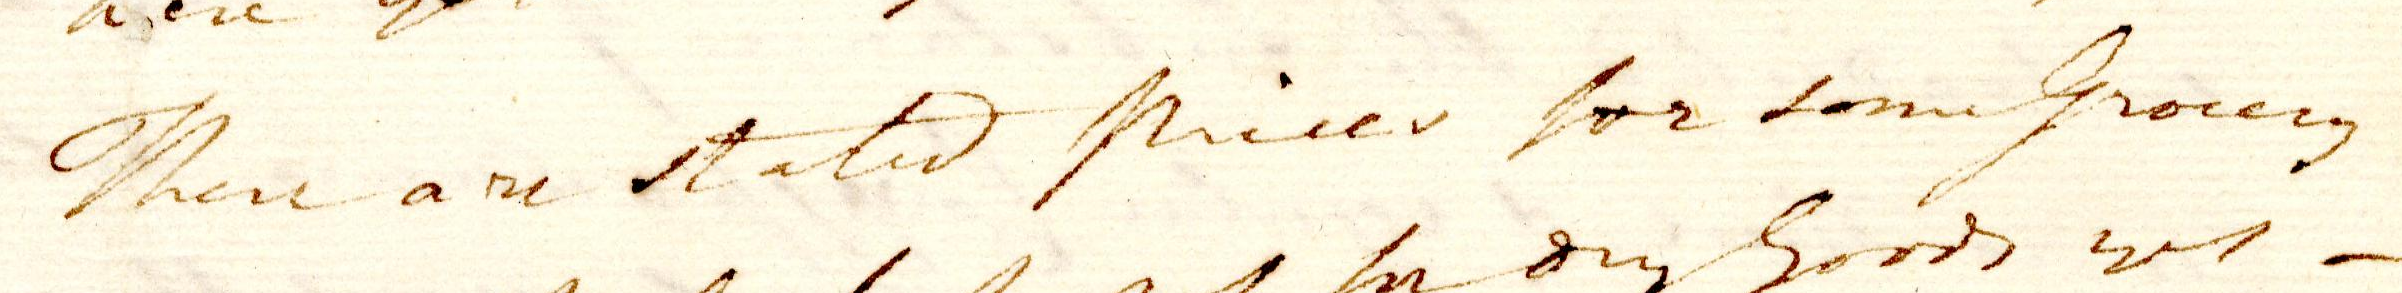There are stated prices for some Grocery
